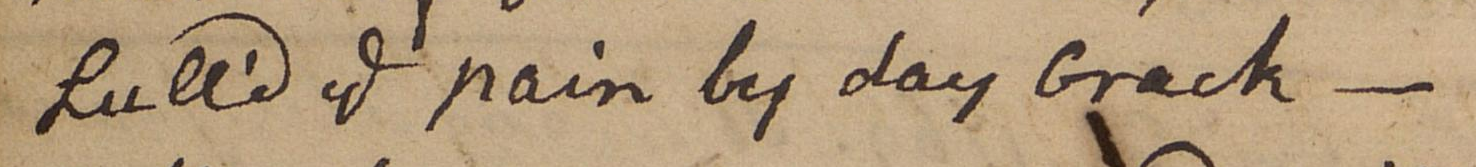Lull'd y^e pain by day brack-
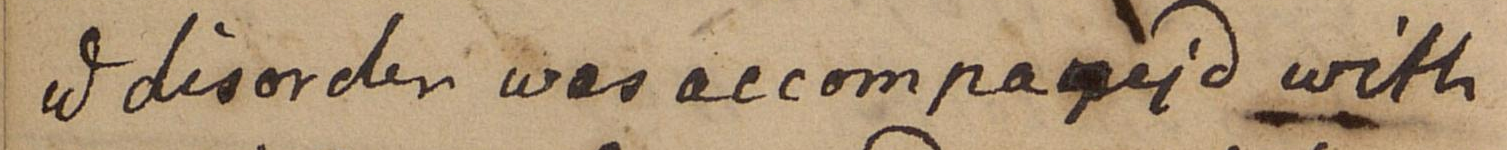y^e disorder was accompany'd with
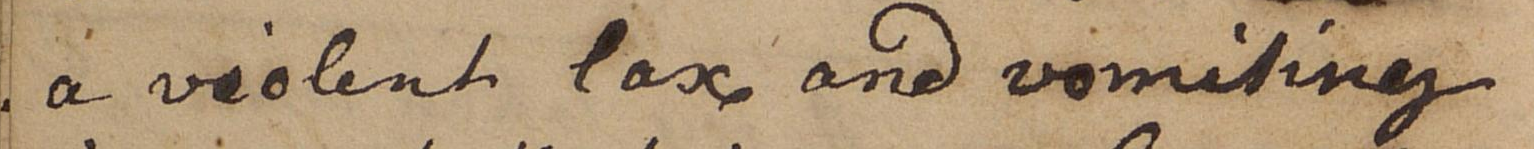a violent lax and vomiting
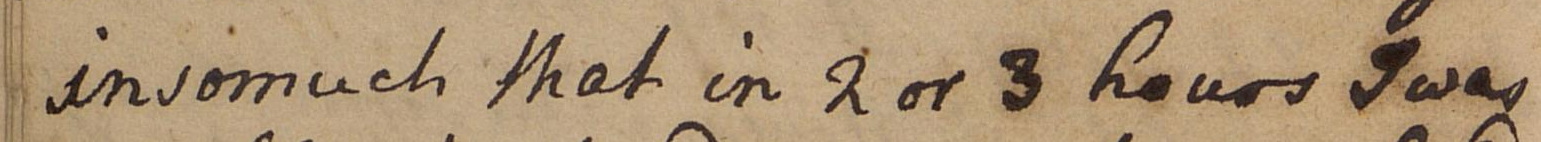insomuch that in 2 or 3 hours I was
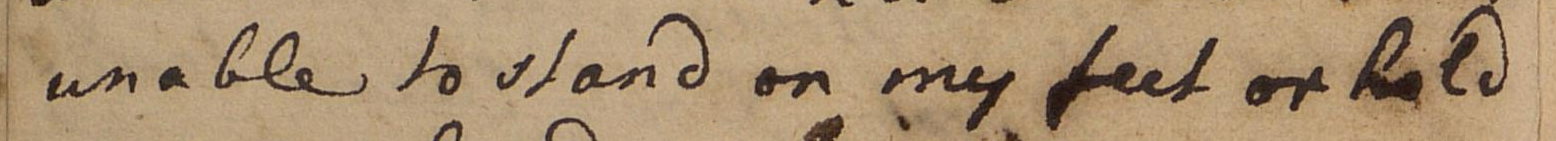unable to stand on my feet or hold
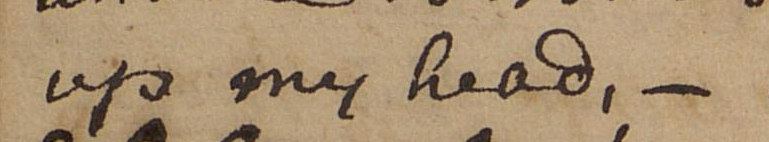up my head,-
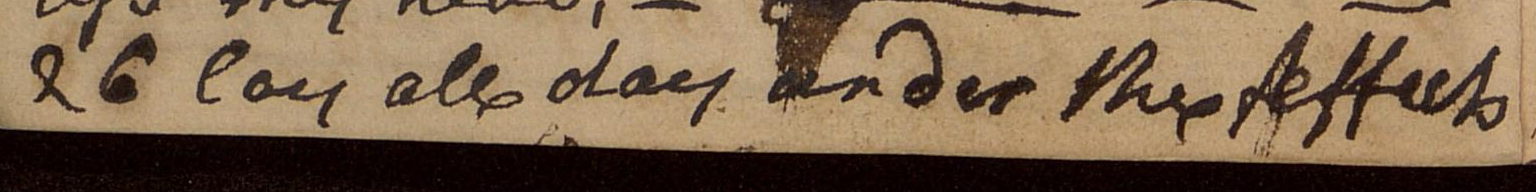26 lay all day under the effects
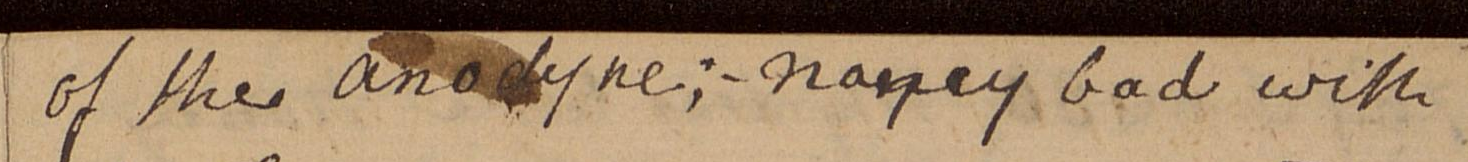of the Anodyne; Nancy bad will
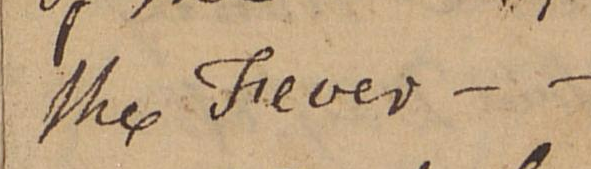the Fever-
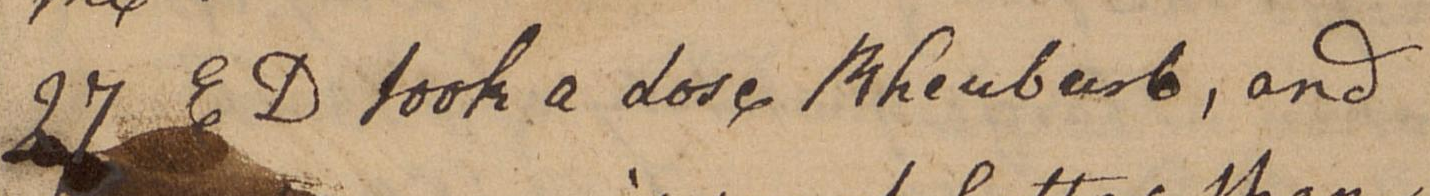27 E D took a dose Rheubarb, and
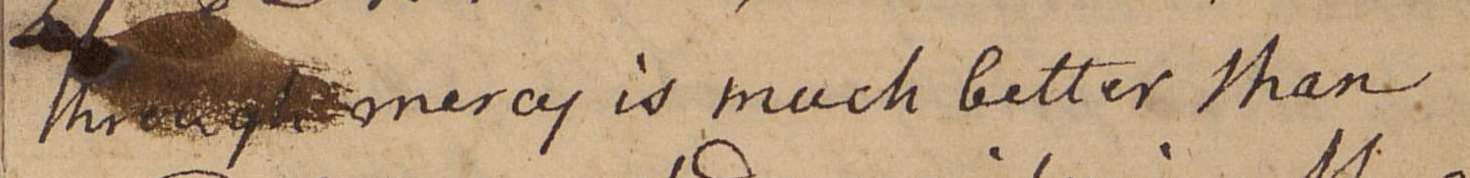through mercy is much better than
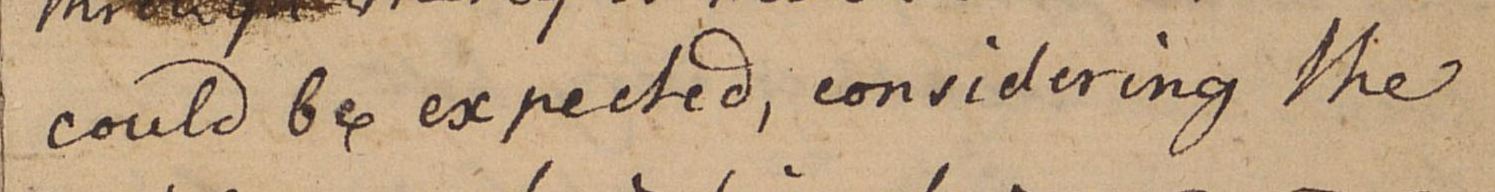could be expected, considering the
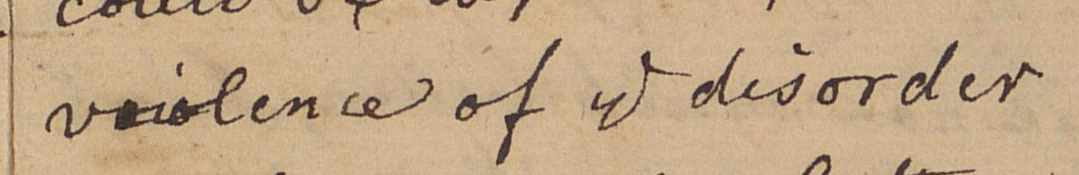voiolence of y^e disorder
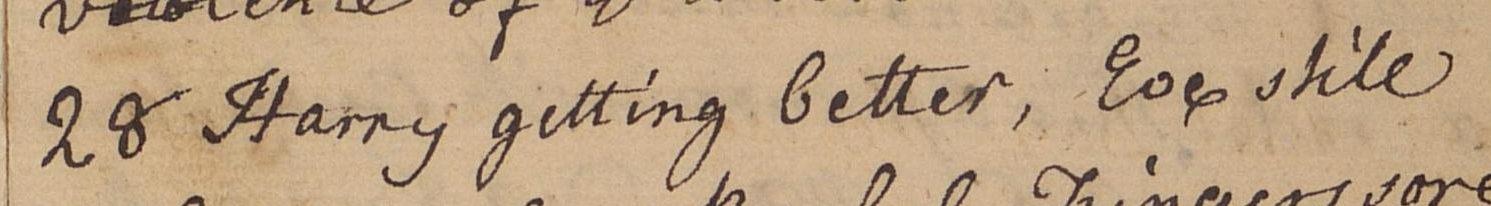28 Harry getting better, Eve still
